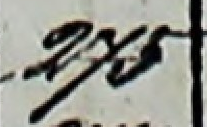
275
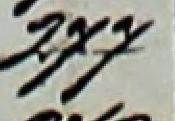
277
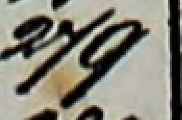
279
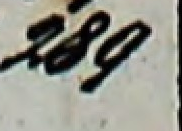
289
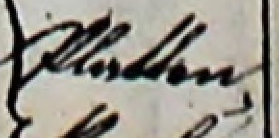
Platten„
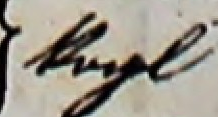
kogl
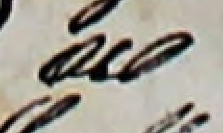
Obs
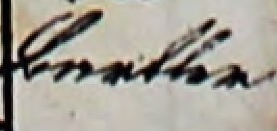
Bartler
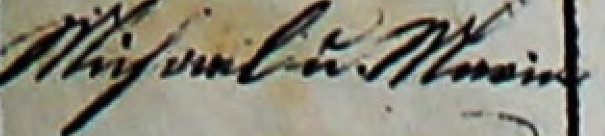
Michael u. Maria
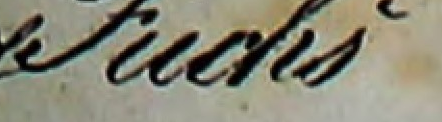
Fuchs
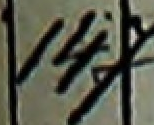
147
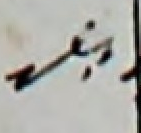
do
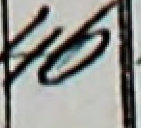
46
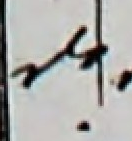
do
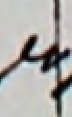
do
